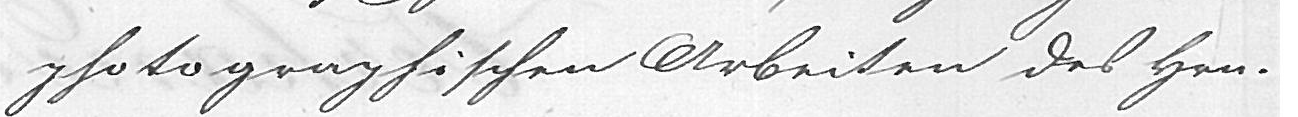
photographischen Arbeiten des Hrn.
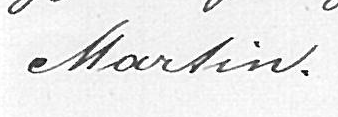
Martin.
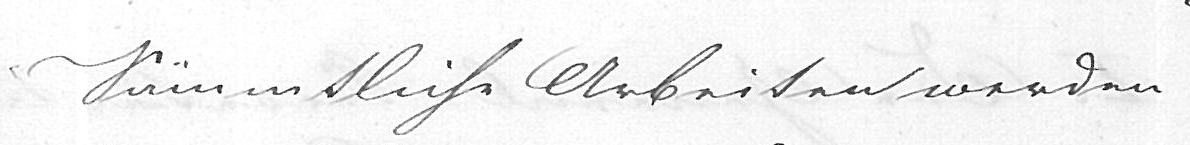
Sämmtliche Arbeiten werden
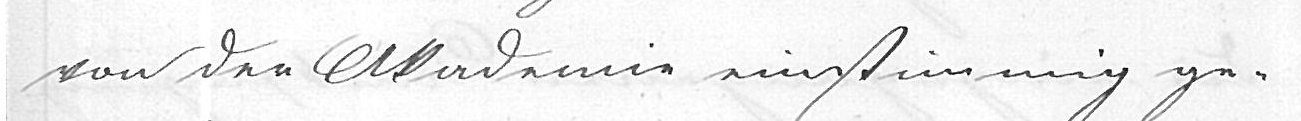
von der Akademie einstimmig ge-
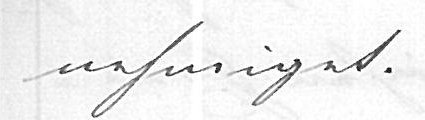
nehmiget.
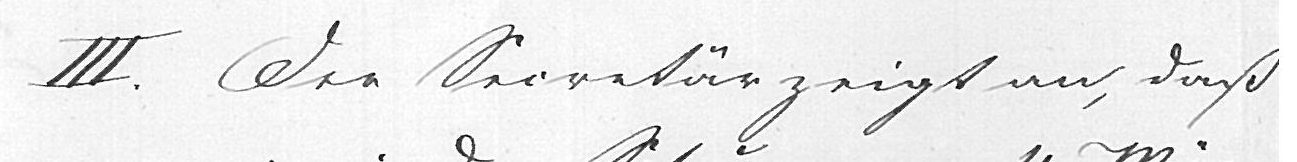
III. Der Secretär zeigt an, daß
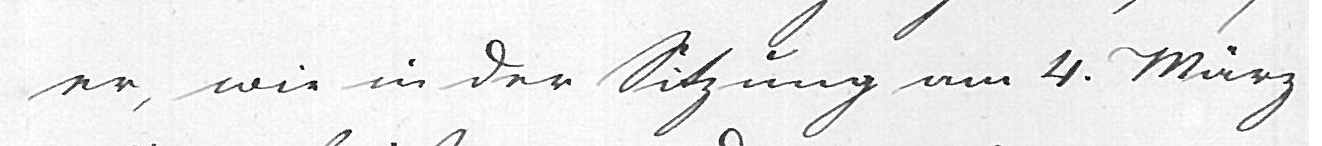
er, wie in der Sitzung an 4. März
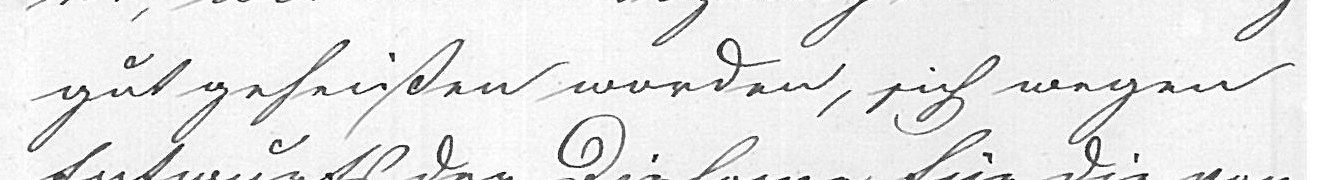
gut geheißen worden, sich wegen
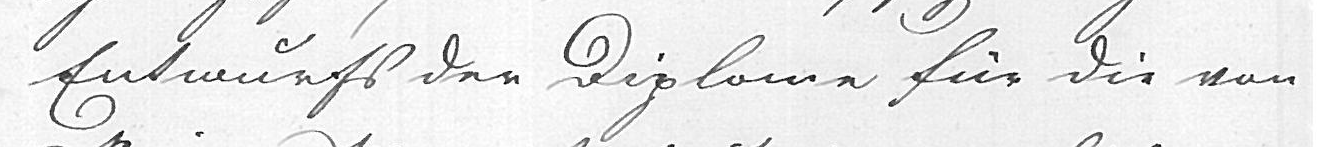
Entwurfs der Diplome für die von
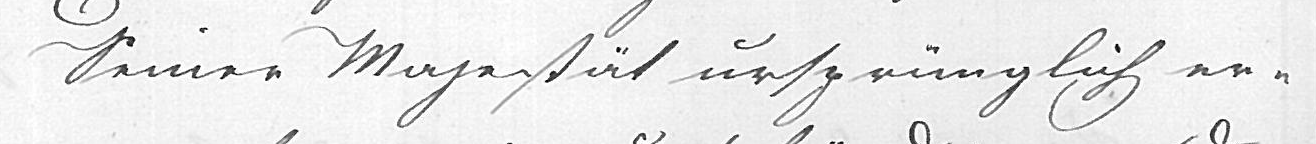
Seiner Majestät ursprünglich er-
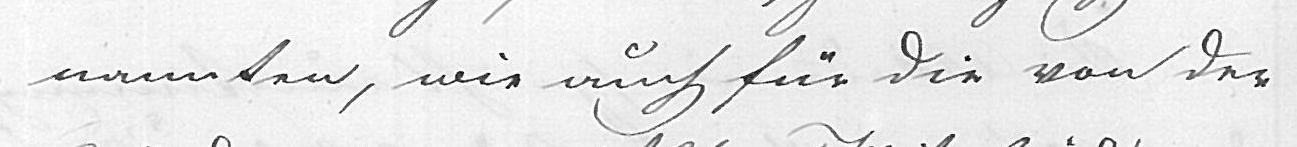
nannten, wie und für die von der
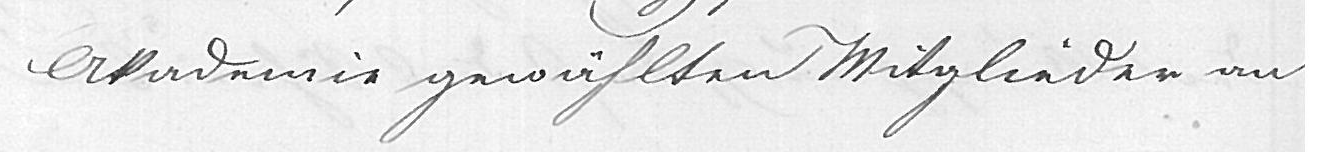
Akademie gewählten Mitglieder an
